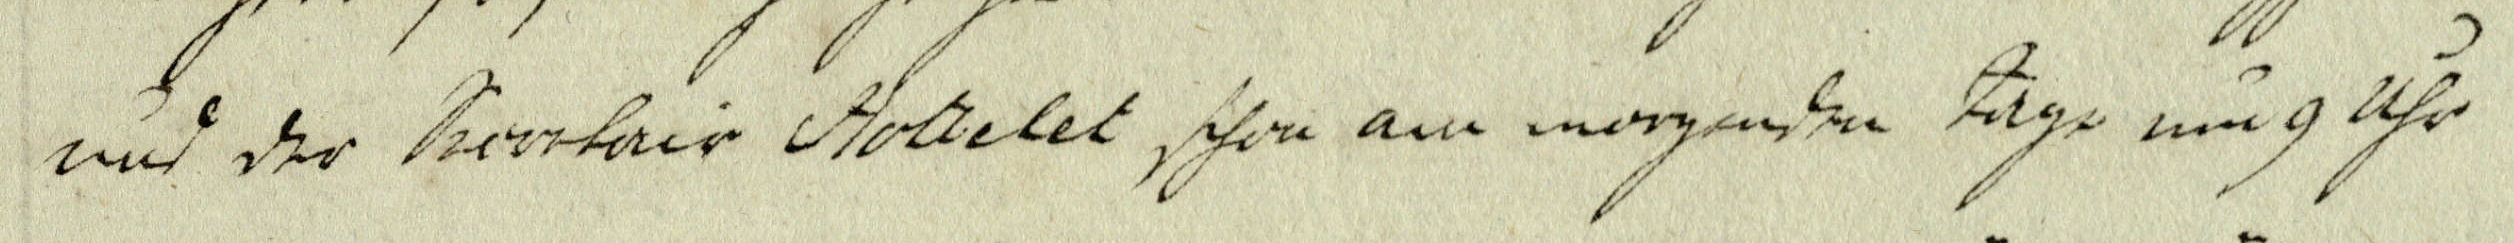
und der Secretair Hottelet , schon am morgenden Tage um 9 Uhr
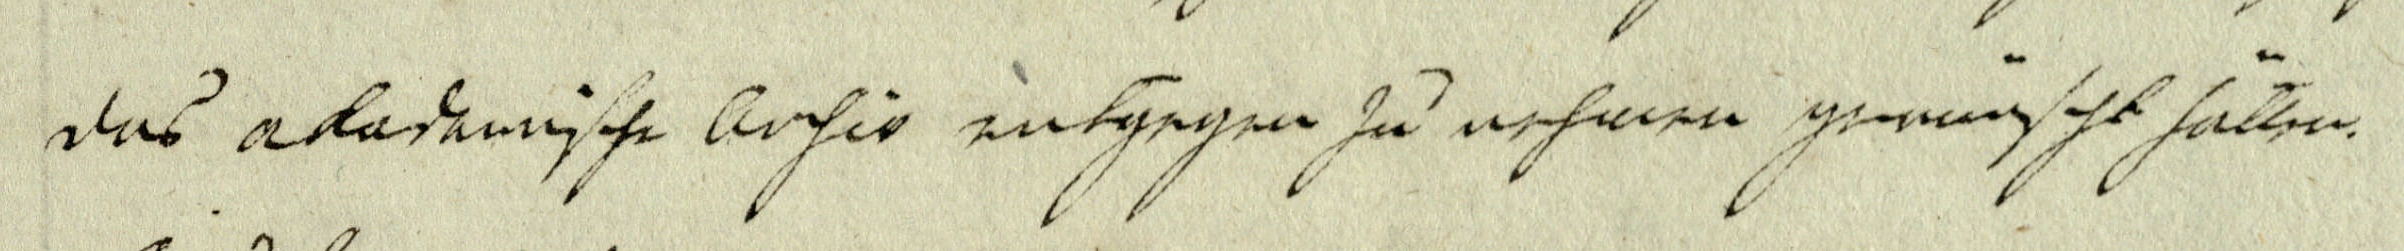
das akademische Archiv entgegen zu nehmen gewünscht hätten.
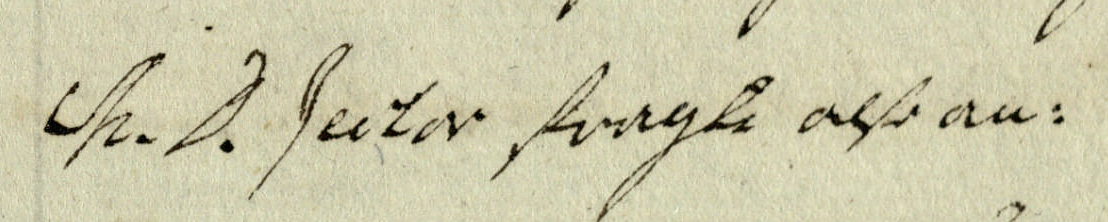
M. D. Rector fragte also an:
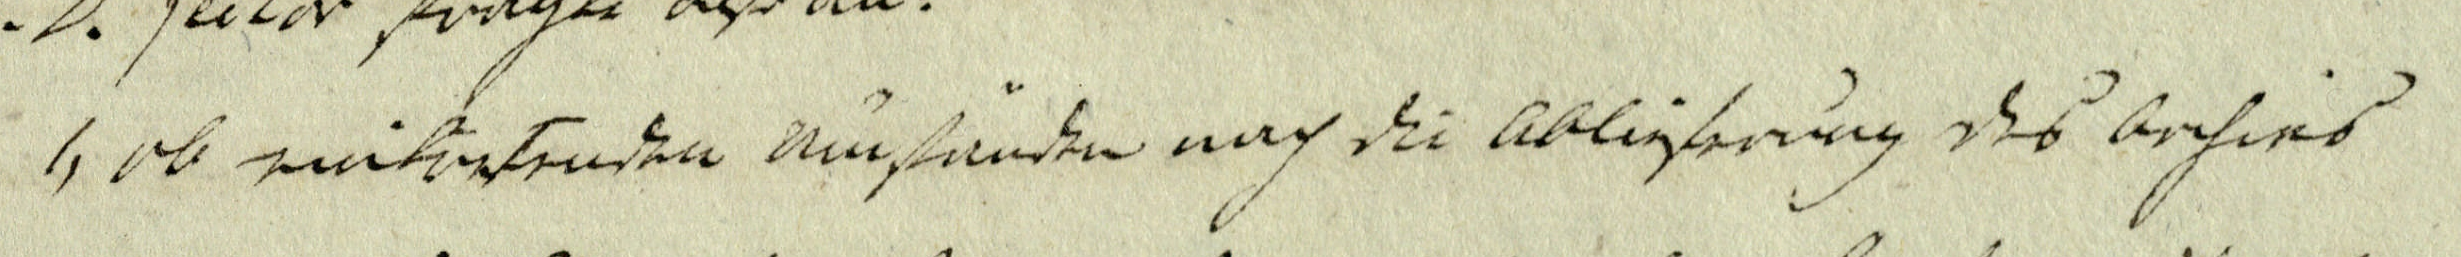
1, ob eintretenden Umständen nach die Ablieferung des Archivs
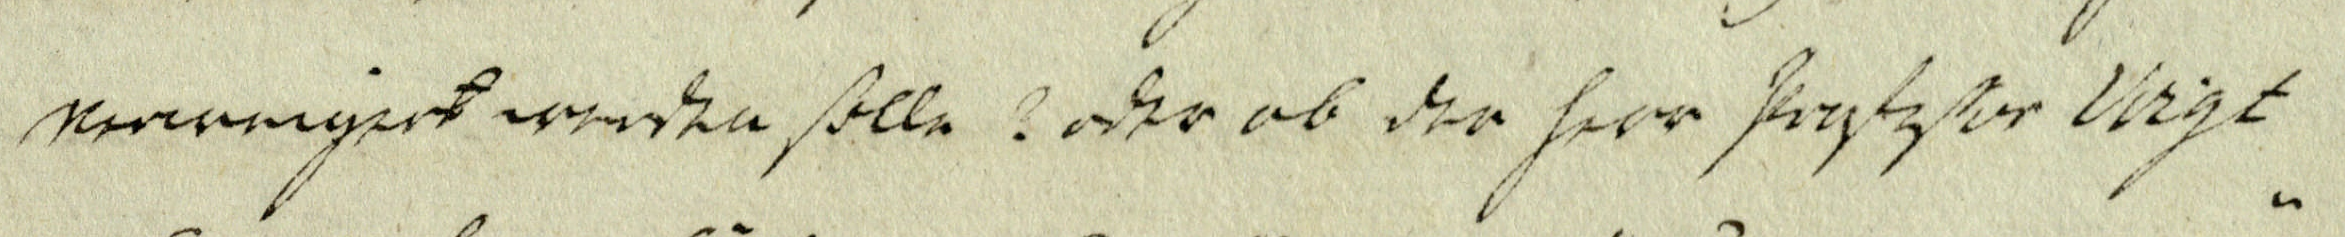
verweigert werden solle? oder ob der Herr Professor Voigt
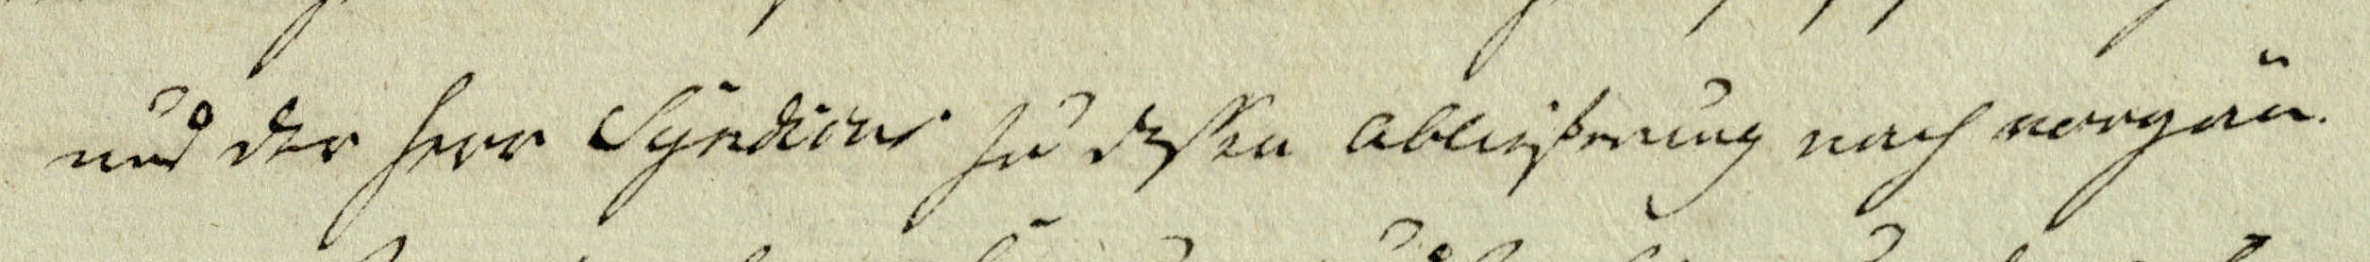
und der Herr Sÿndicus zu dessen Ablieferung nach vorgän¬
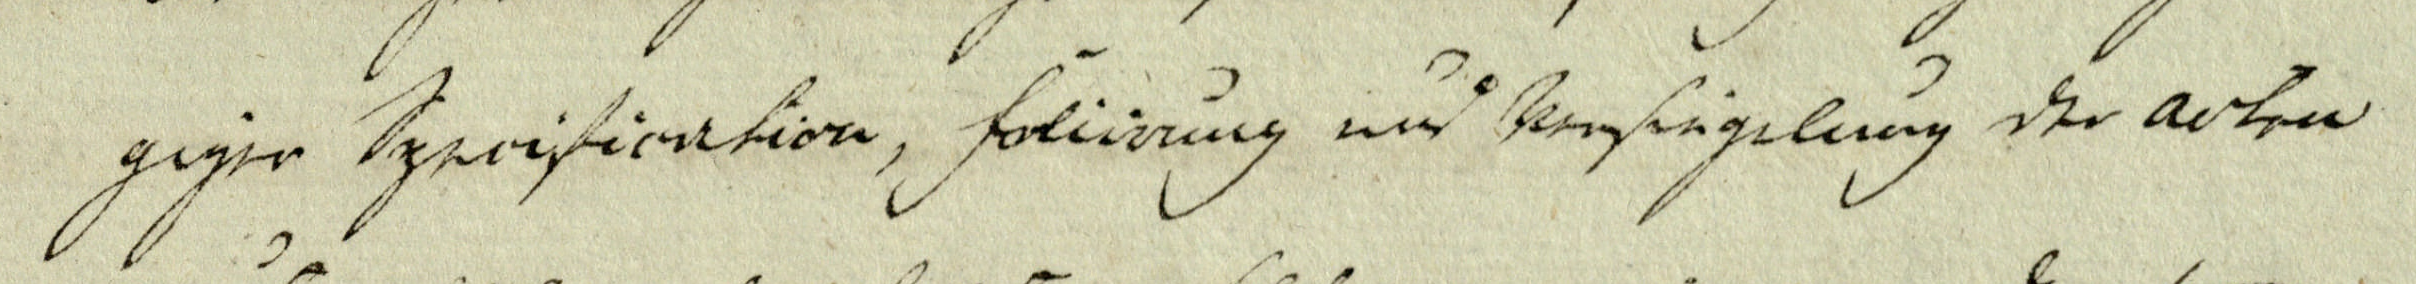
giger Specification, Foliirung und Versiegelung der Acten
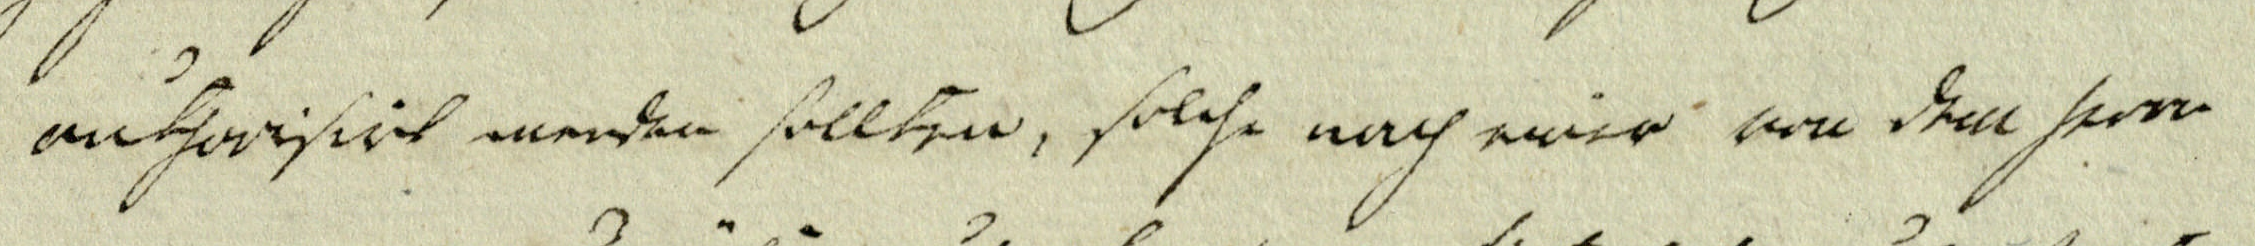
authorisirt werden sollten, solche nach einer von dem Herrn
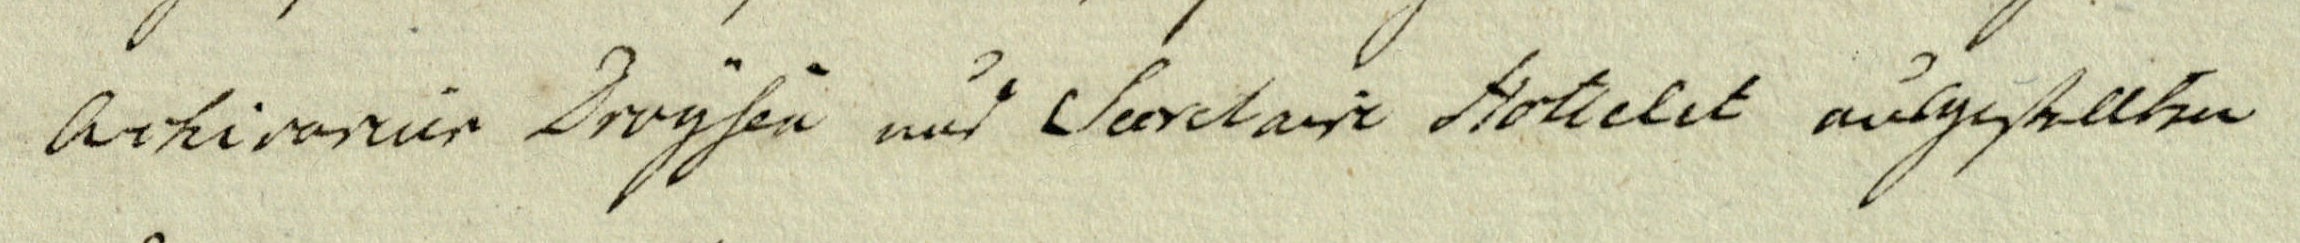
Archivarius Droÿsen und Secretaire Hottelet ausgestellten
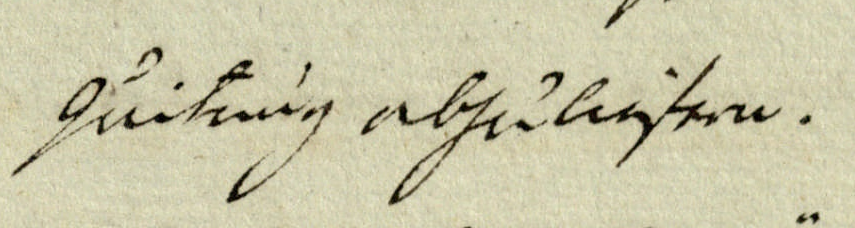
Quitung abzuliefern.
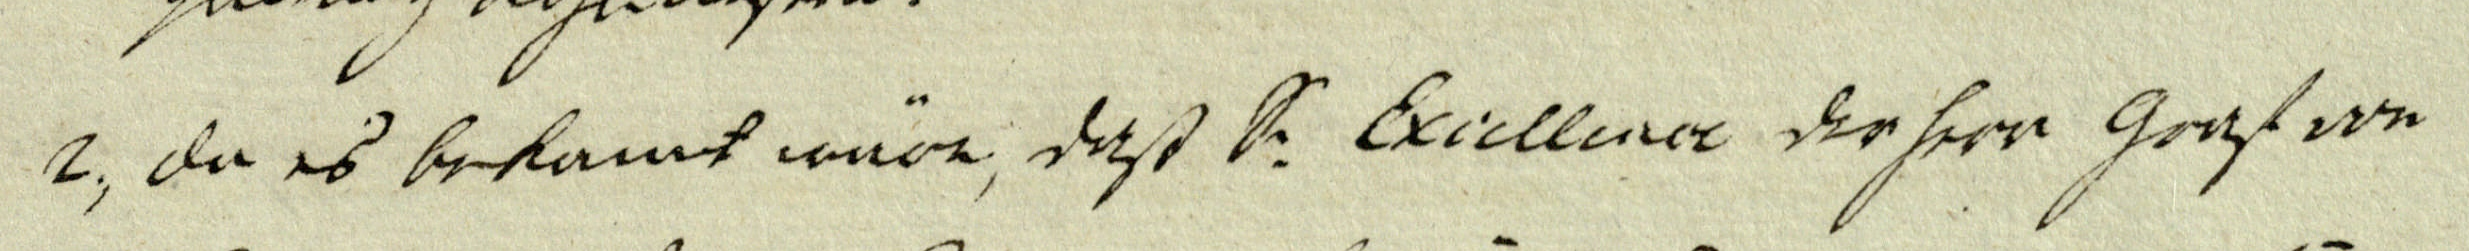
2, da es bekannt wäre, daß Sr. Excellence der Herr Graf von
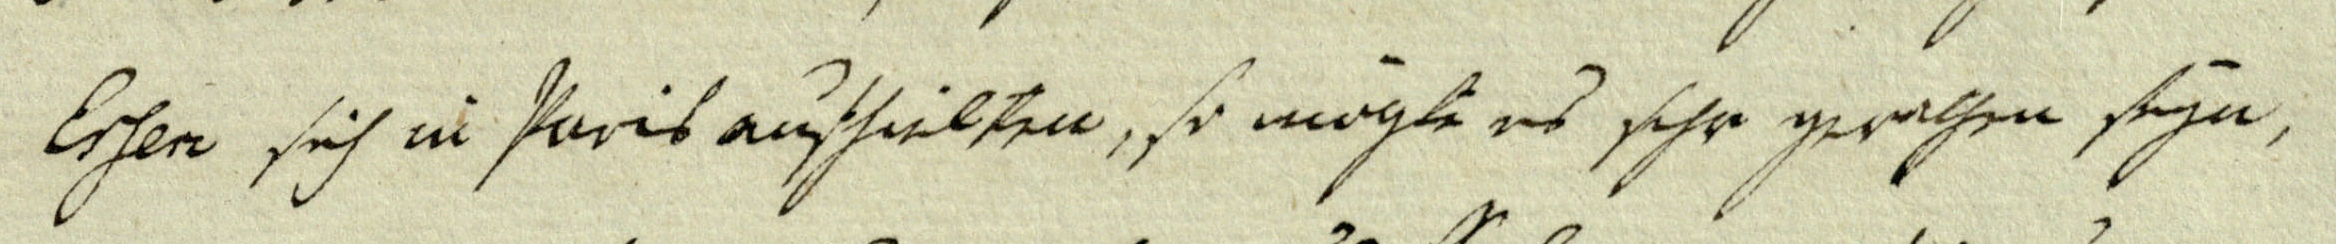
Essen sich in Paris aufhielten, so mögte es sehr gerathen seÿn,
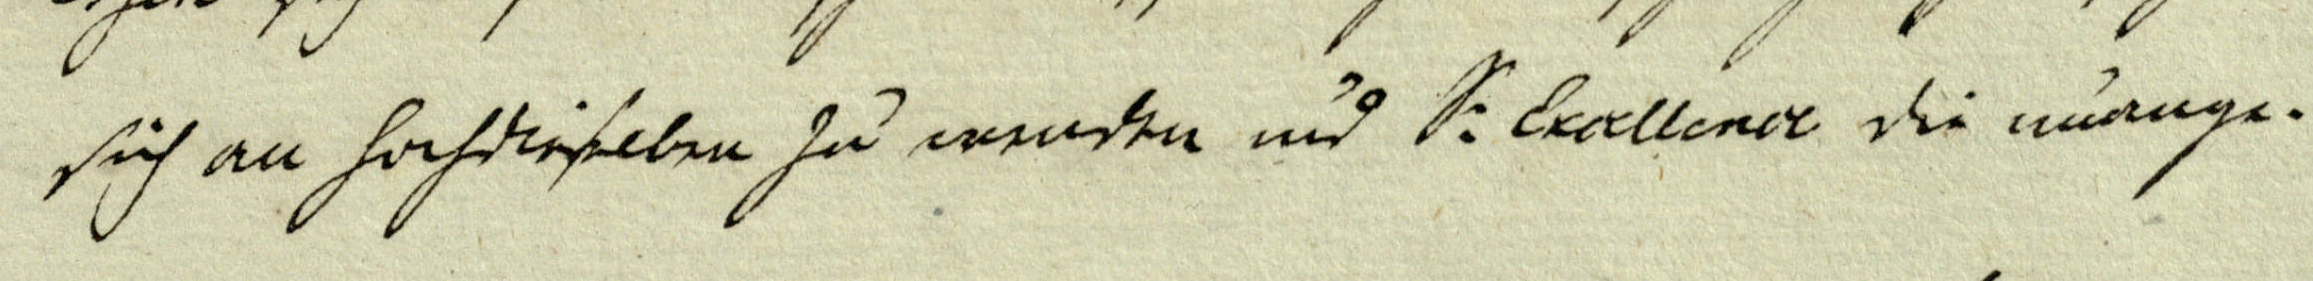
sich an Hochdieselben zu wenden und Sr Excellence die unange¬
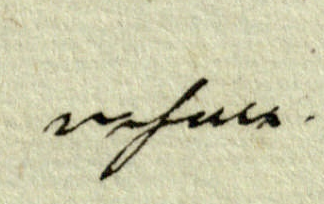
nehme
